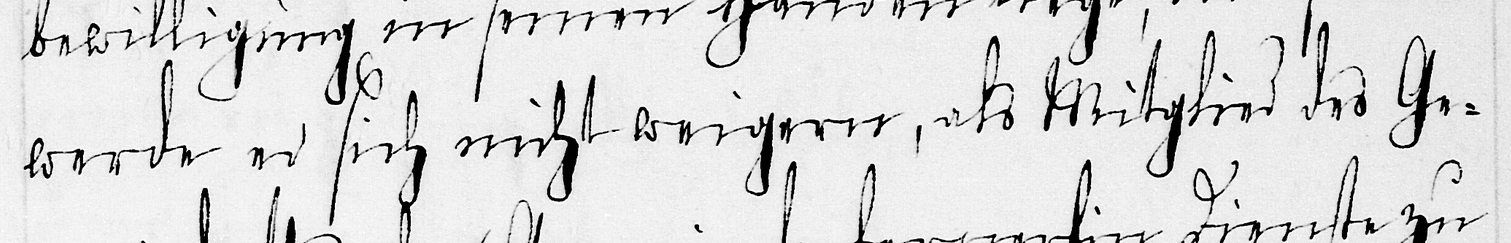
werde er sich nicht weigern, als Mitglied des Ge¬
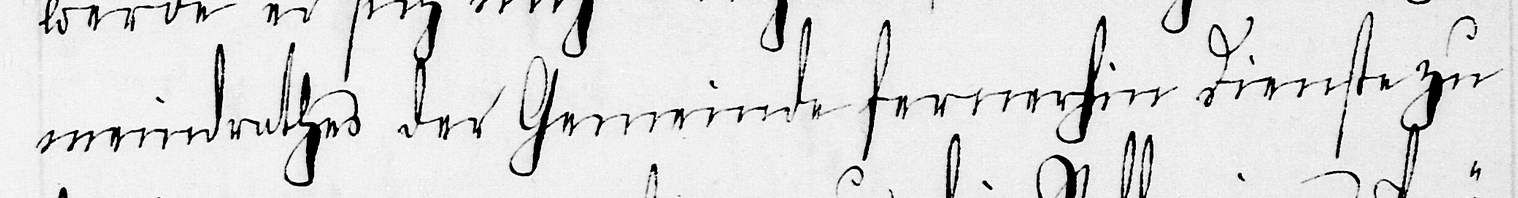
meindrathes der Gemeinde fernerhin Dienste zu
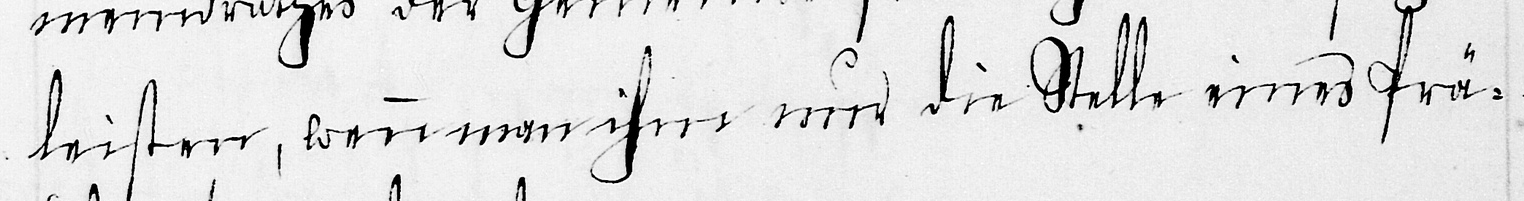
leisten, wenn man ihm nur die Stelle eines Prä¬
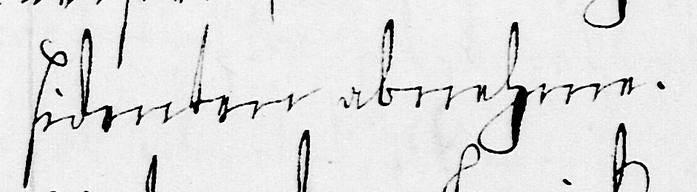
sidenten abnehme.
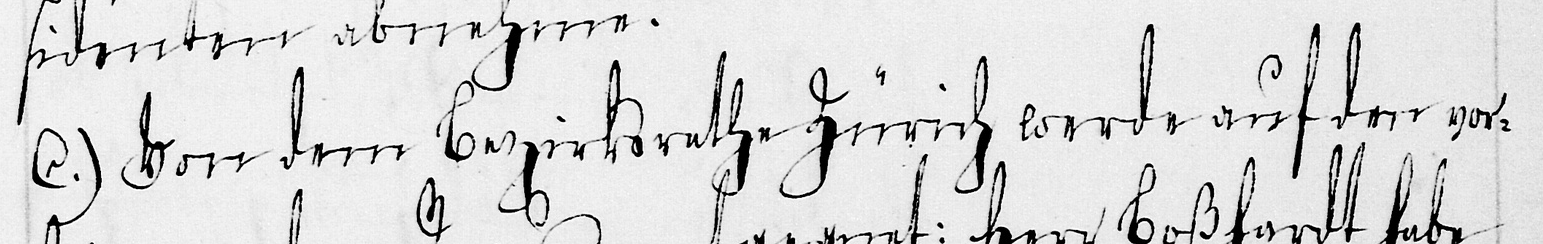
C.) Von dem Bezirksrathe Zürich werde auf den vor¬
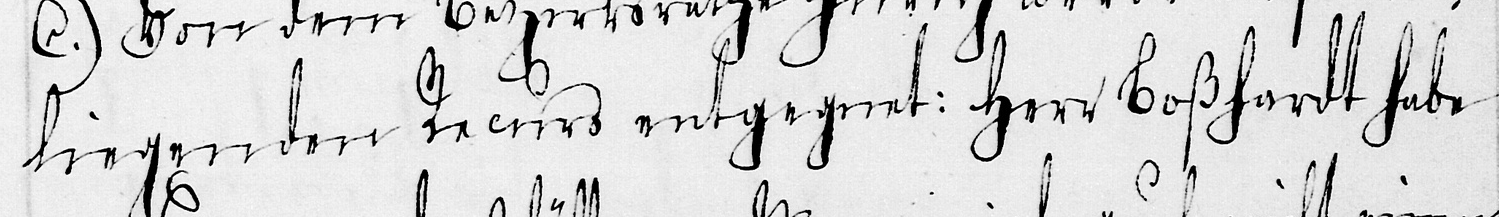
liegenden Recurs entgegnet: Herr Boßhardt habe
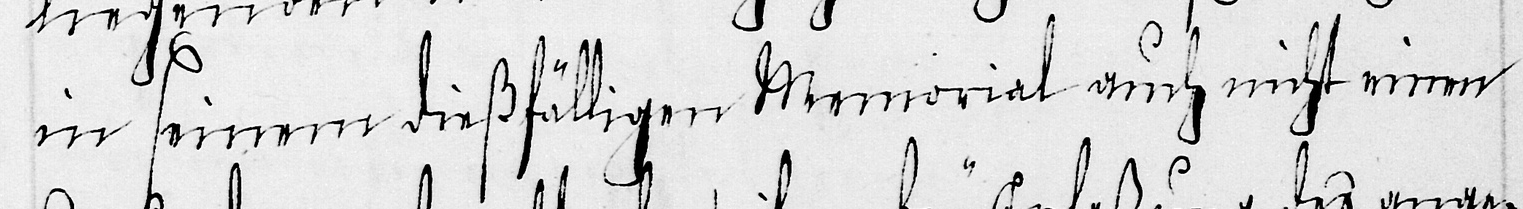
in seinem dießfälligen Memorial auch nicht einen
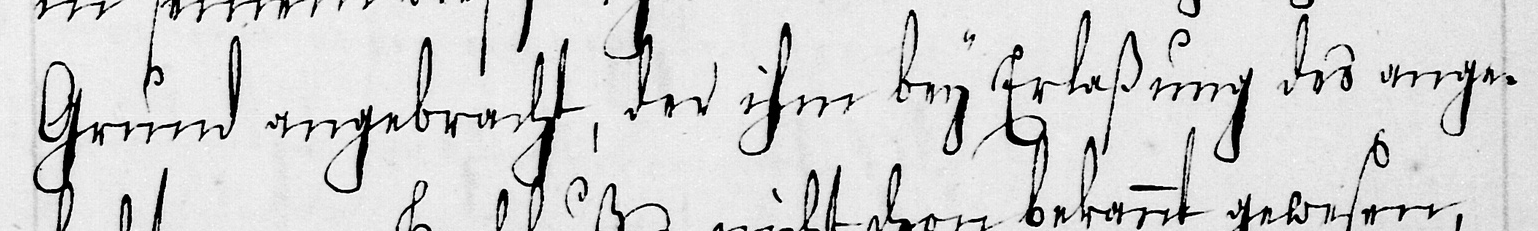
Grund angebracht, der ihm bey Erlaßung des ange¬
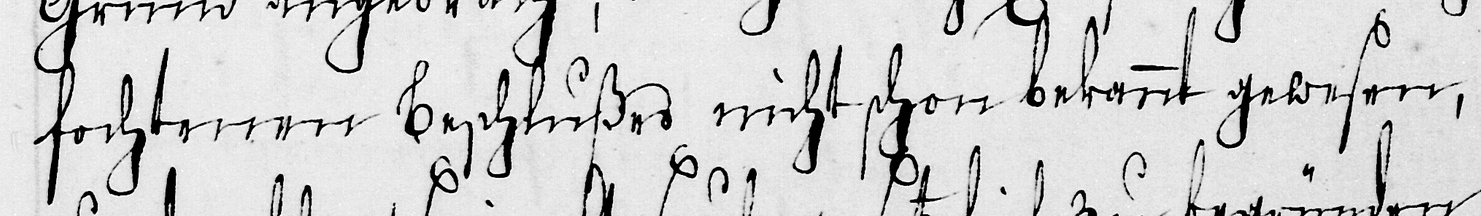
fochtenen Beschlußes nicht schon bekannt gewesen,
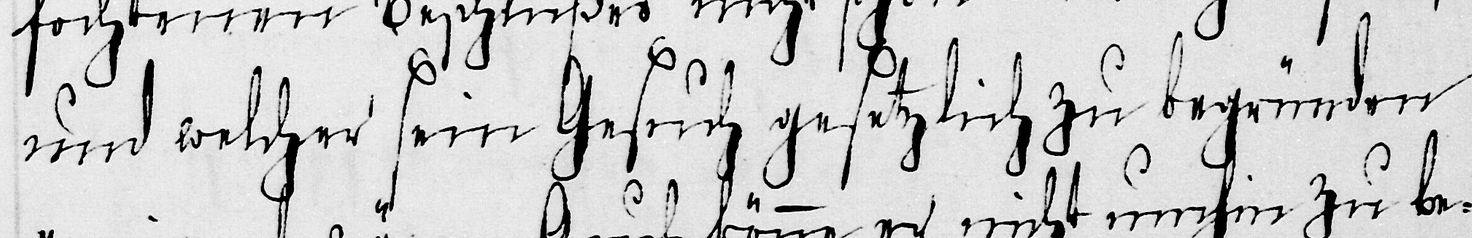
und welcher sein Gesuch gesetzlich zu begründen
